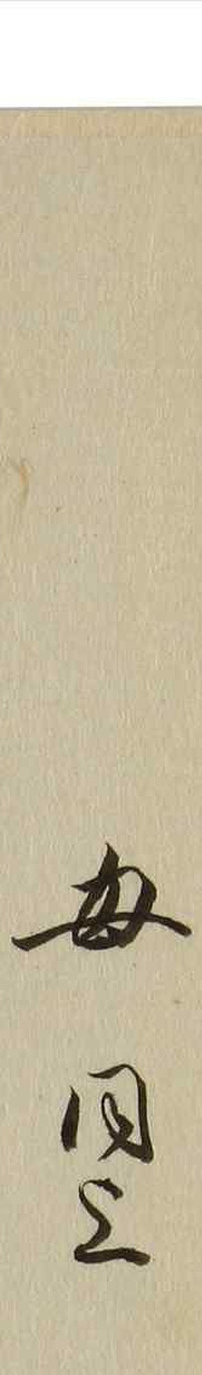母同上
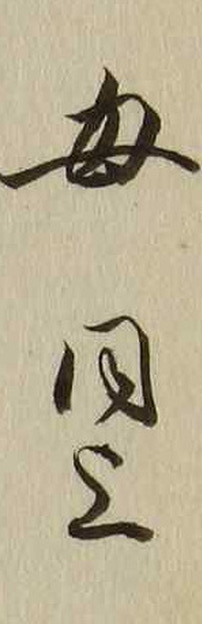母同上
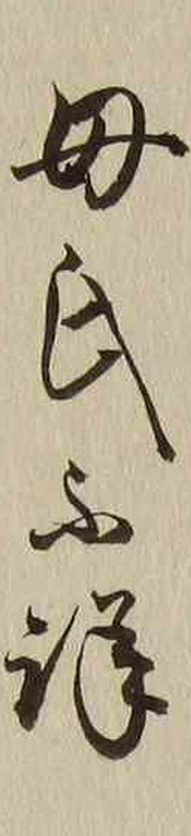母氏不詳
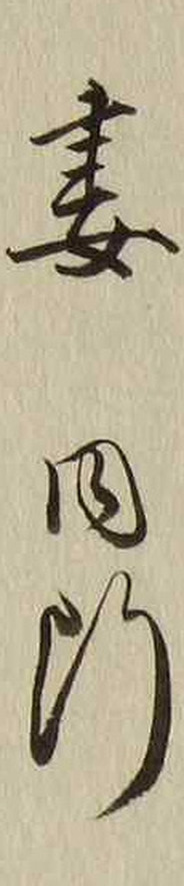妻同断
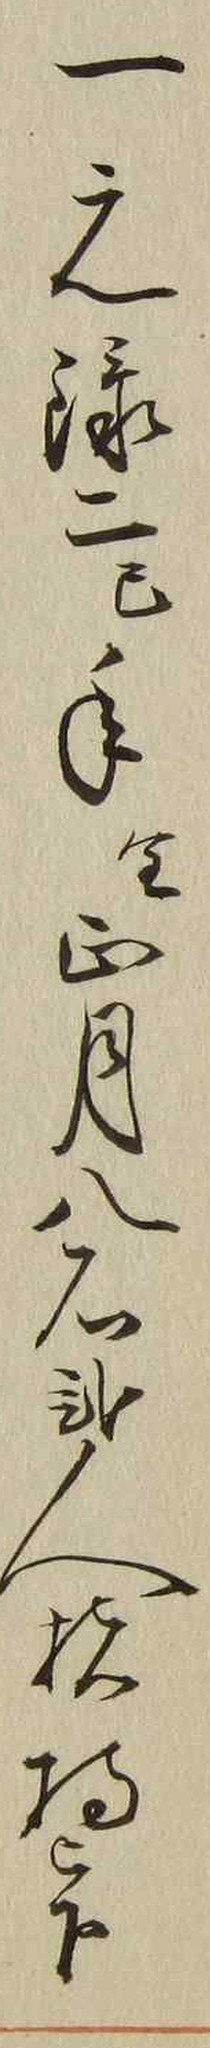一元禄二巳年閏正月八石弐人扶持被下
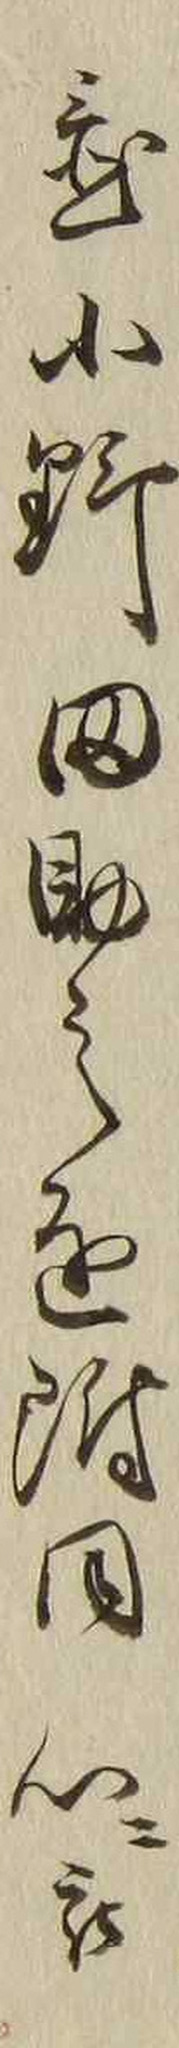置小野田助之進附同心ニ被

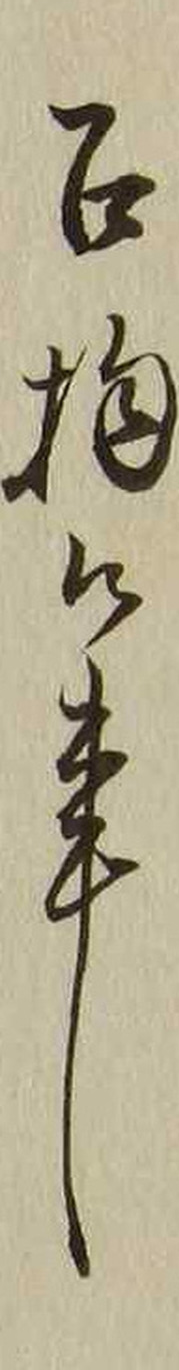召抱候事
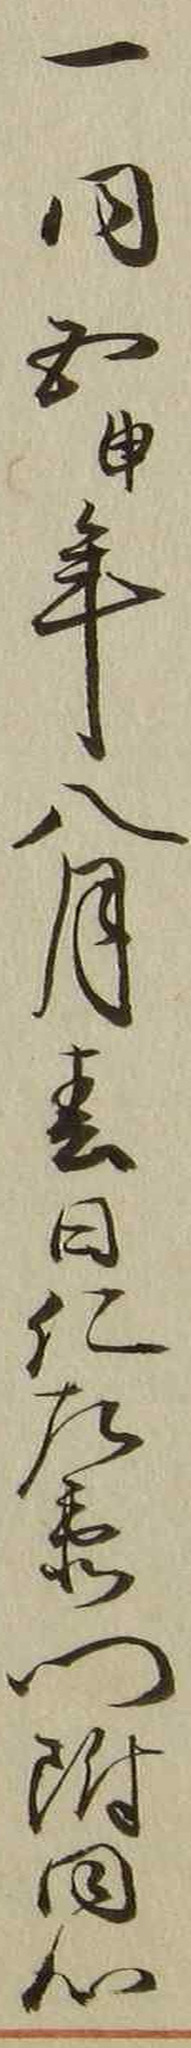一同五申年八月春日仁左衛門附同心
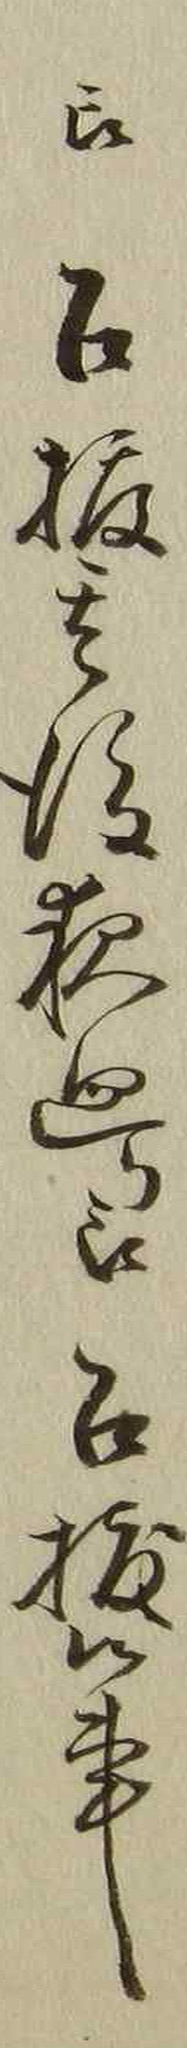被召抜其後夜廻り被召抜候事
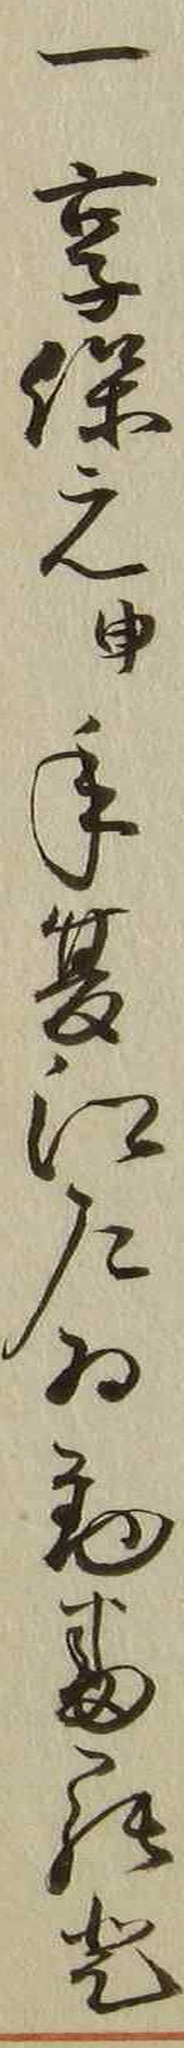一享保元申年夏江戸為勤番罷登
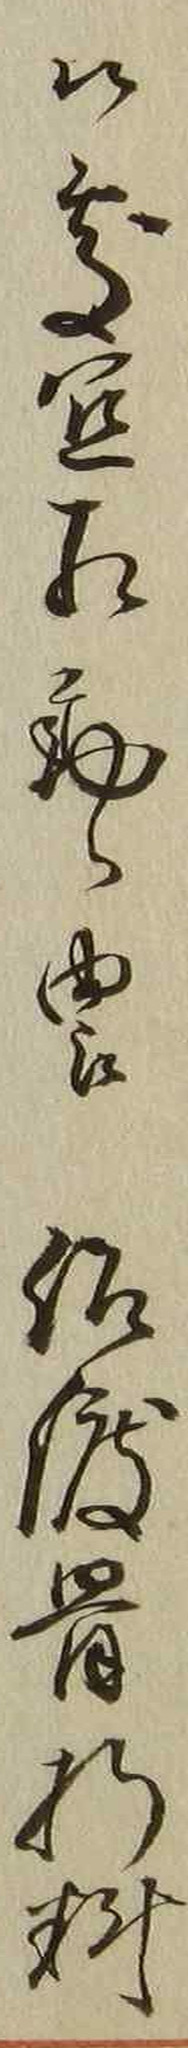候処宜相勤候由被仰渡骨折料
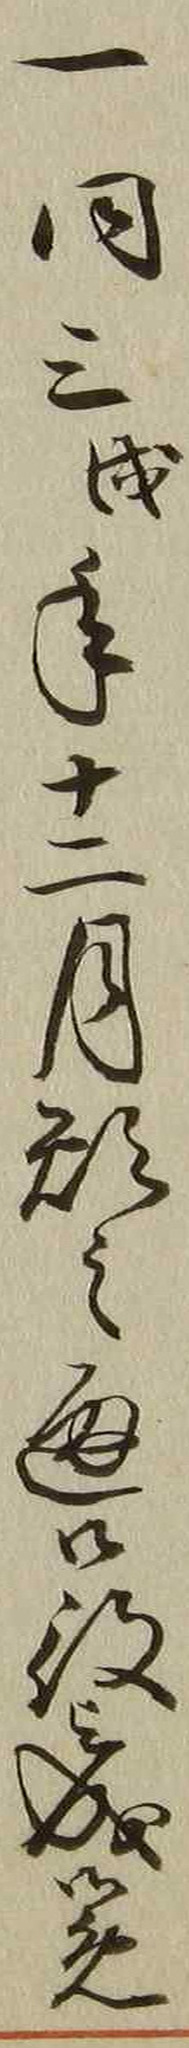一同三戌年十二月願之通御役被成御免
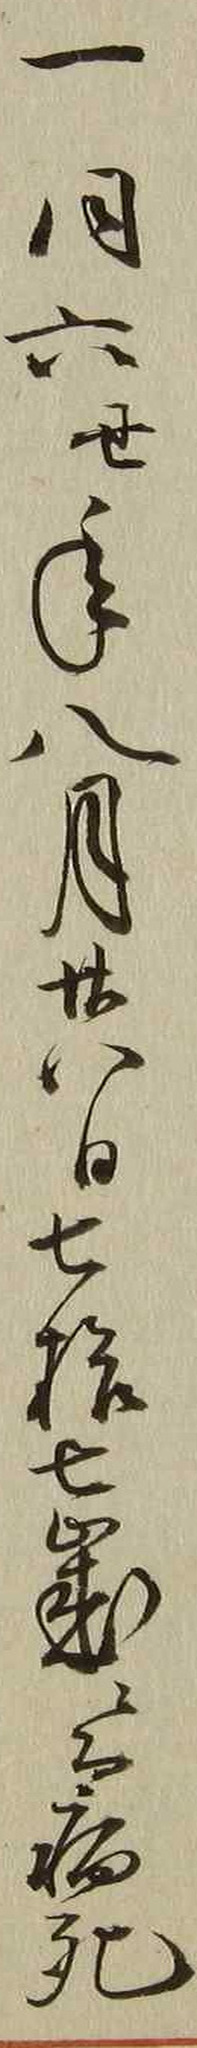一同六丑年八月廿八日七拾七歳ニ而病死
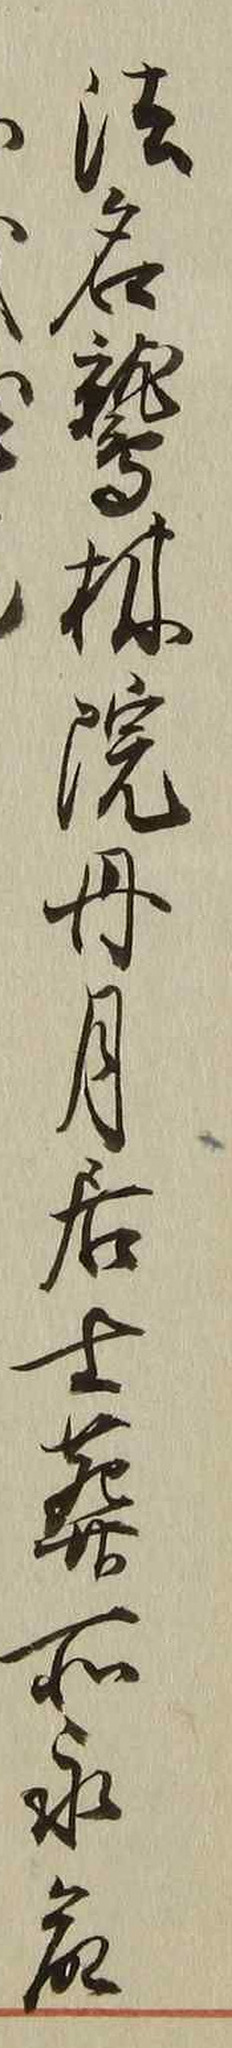法名鷲林院丹月居士葬所永命
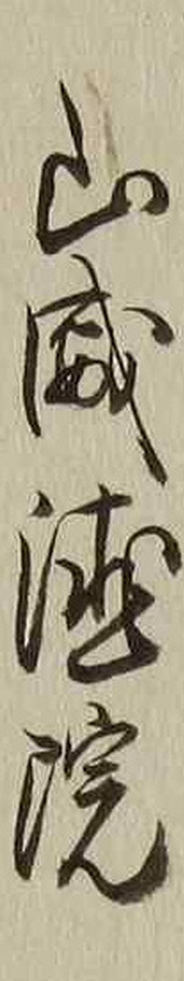山威徳院
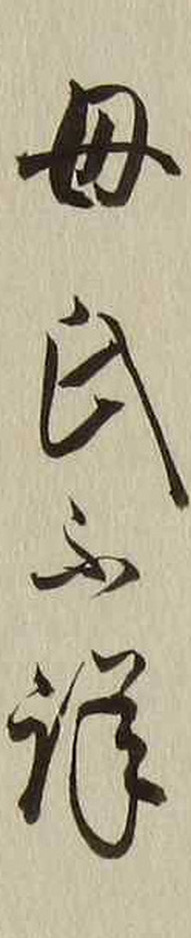母氏不詳
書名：諸士系譜　巻之57　ほ之部4
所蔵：会津若松市立会津図書館
